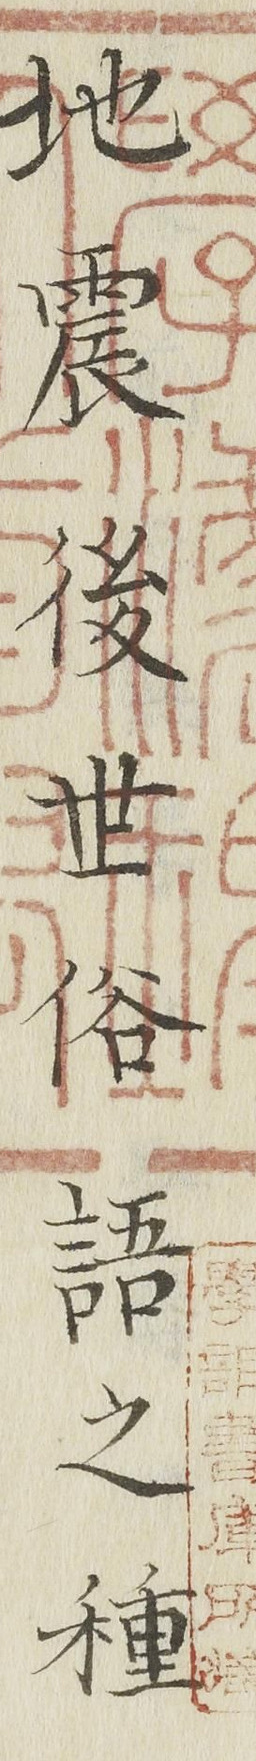地震後世俗語之種
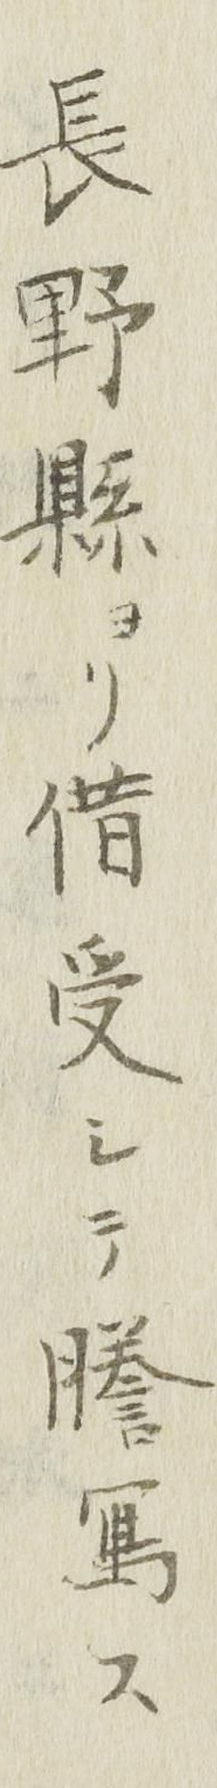長野県ヨリ借受シテ謄写ス

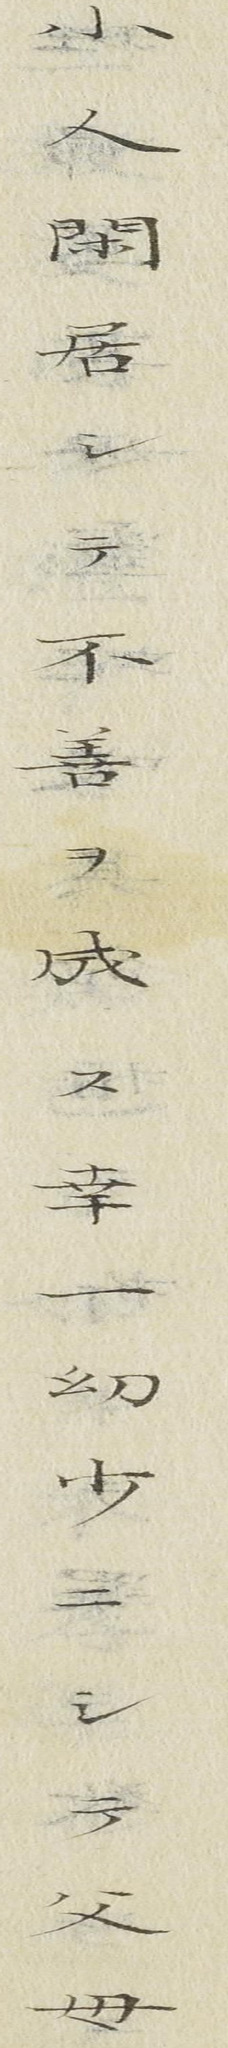小人閑居シテ不善ヲ成ス幸一幼少ニシテ父母
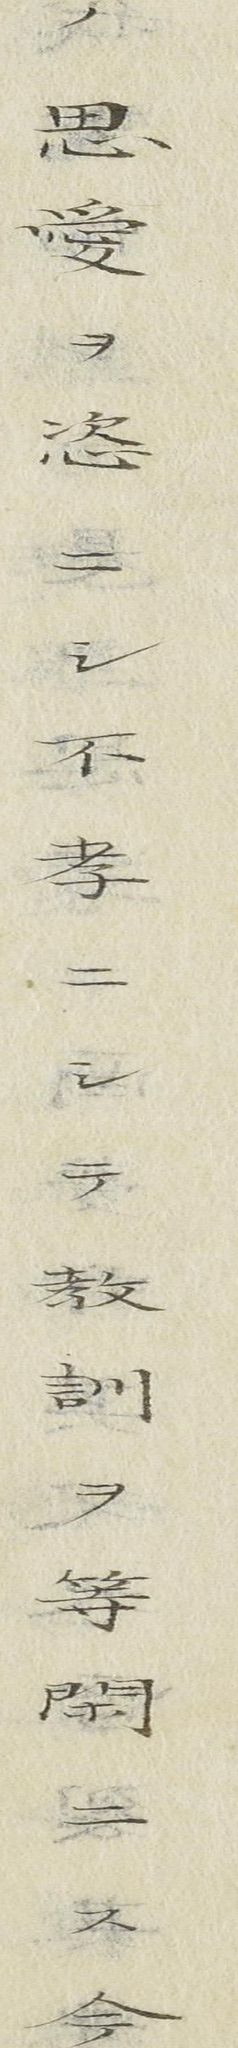ノ思愛ヲ恣ニシ不孝ニシテ教訓ヲ等閑ニス今
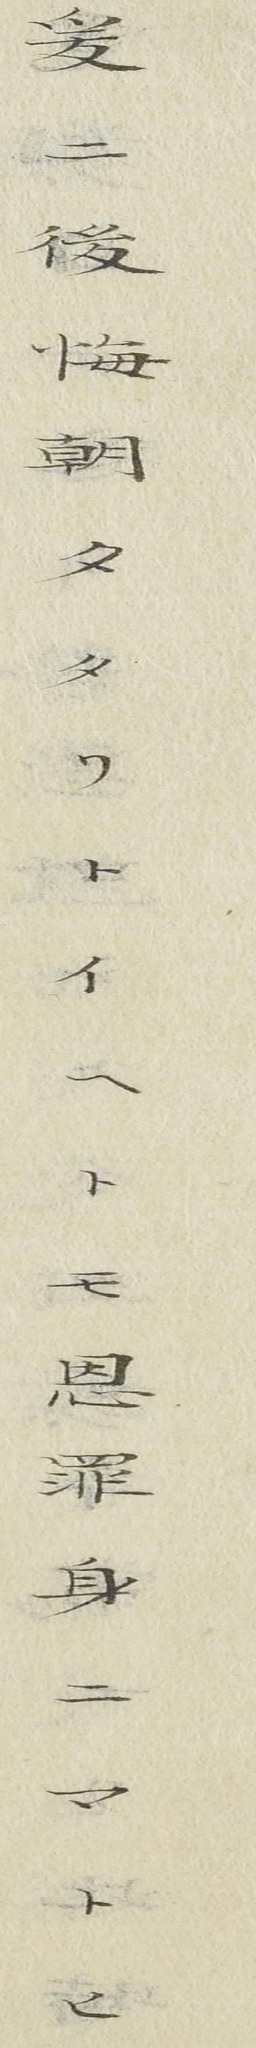爰ニ後悔朝夕タリトイヘトモ恩罪身ニマトヒ
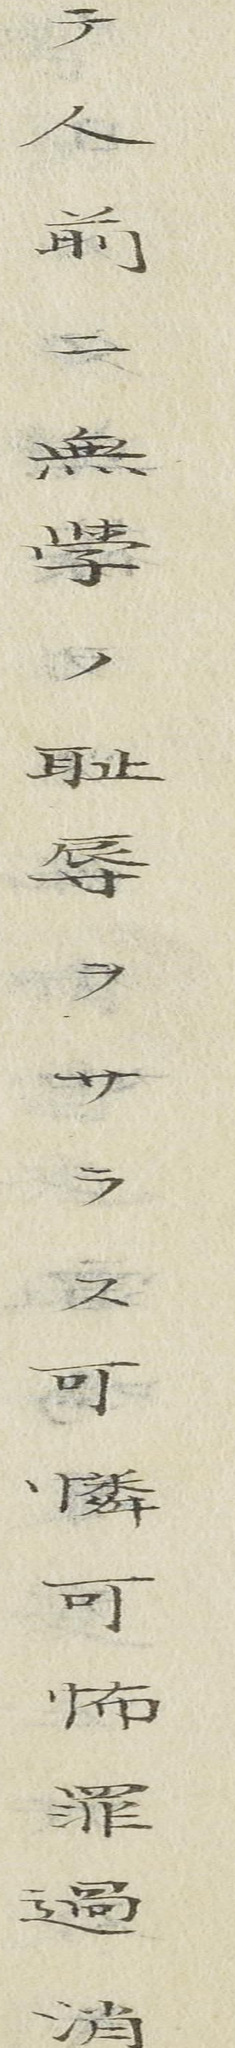テ人前ニ無学ノ恥辱ヲサラス可憐可怖罪過消
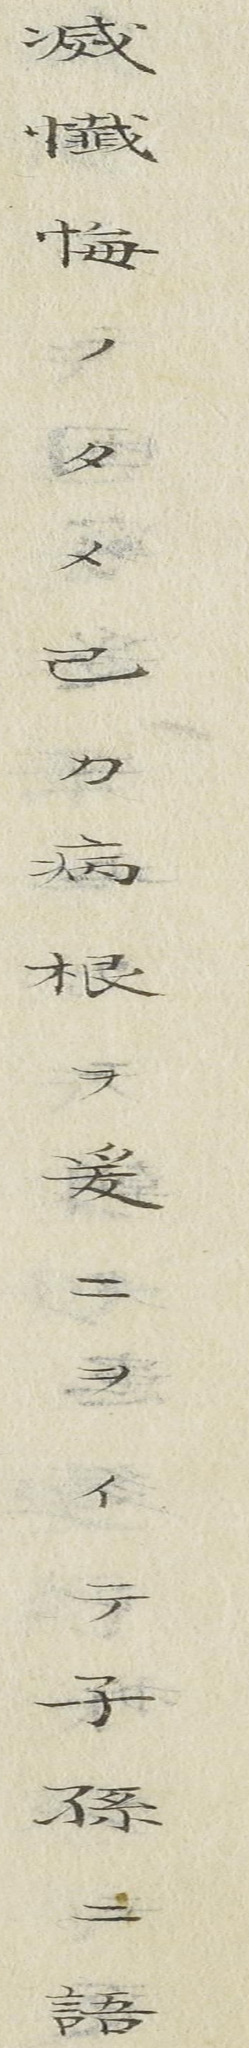滅懺悔ノタメ己カ病根ヲ爰ニヲイテ子孫ニ語
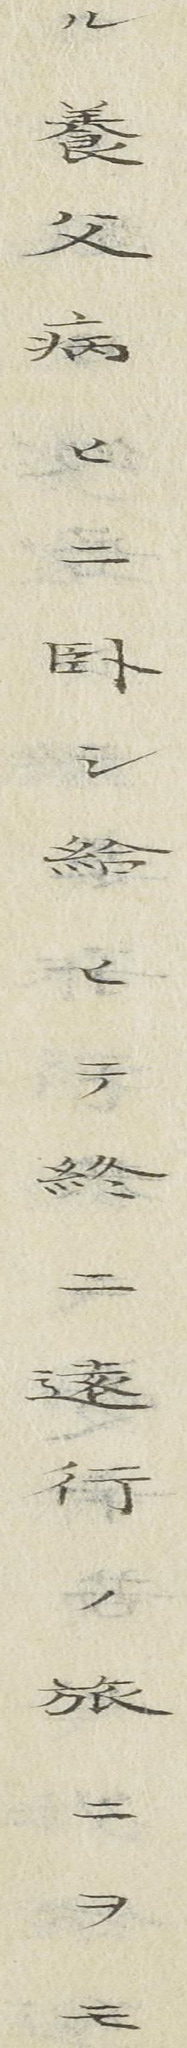ル養父病ヒニ臥シ給ヒテ終ニ遠行ノ旅ニヲモ
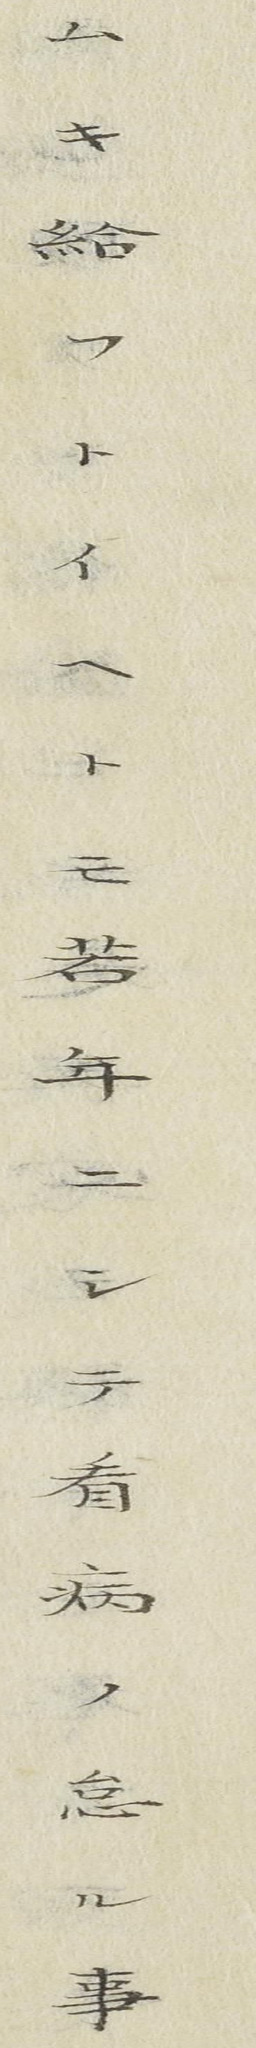ムキ給フトイヘトモ若年ニシテ看病ノ怠ル事
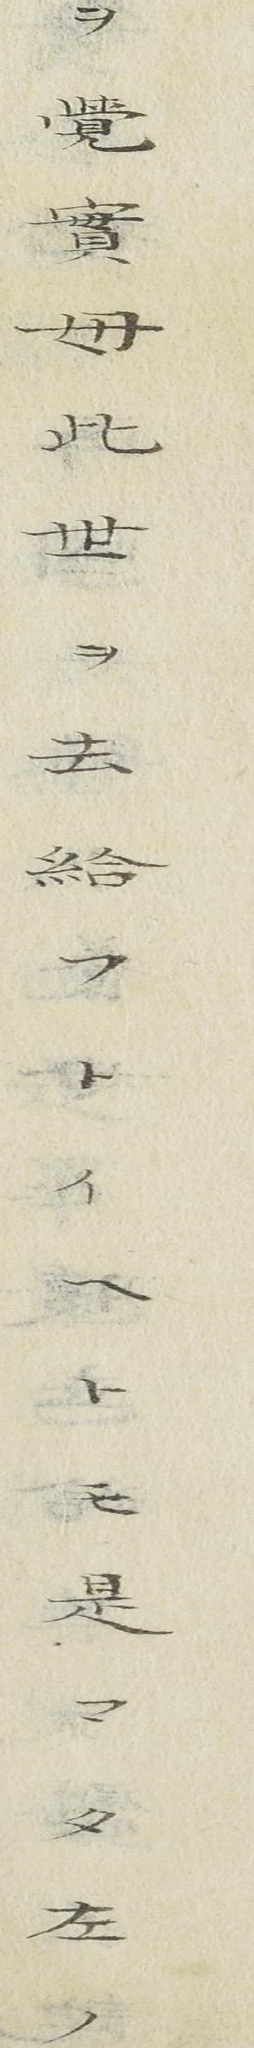ヲ覚実母此世ヲ去給フトイヘトモ是マタ左ノ
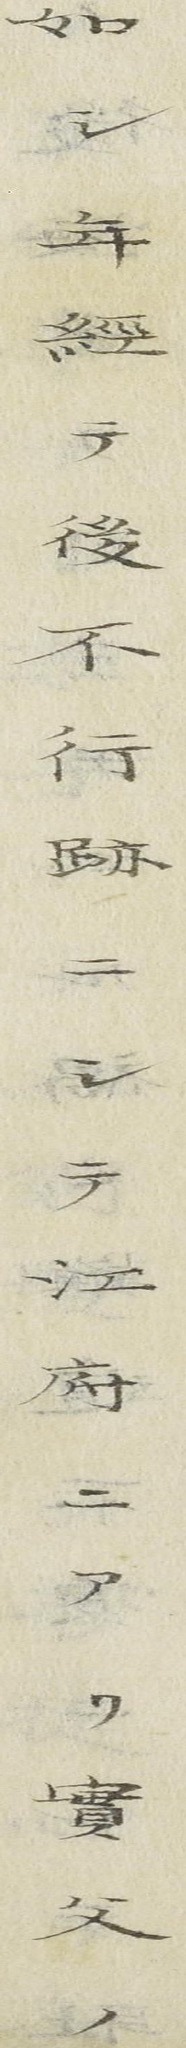如シ年経テ後不行跡ニシテ江府ニアリ実父ノ
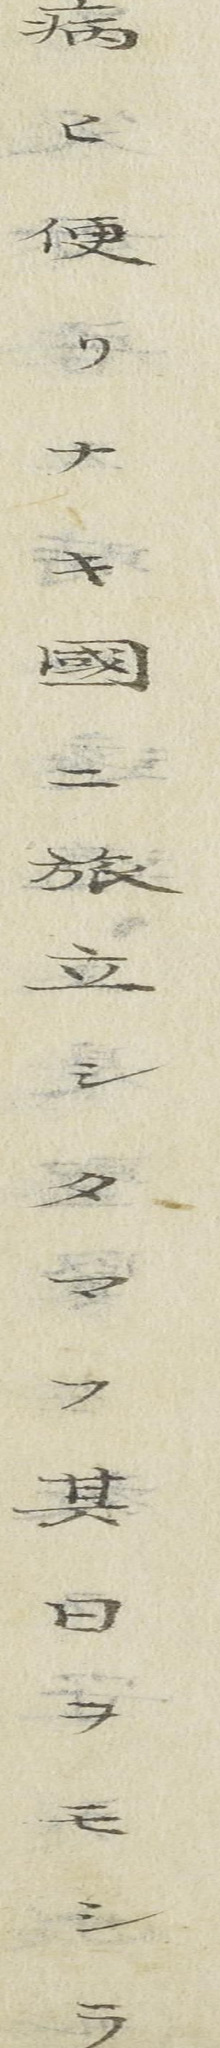病ヒ便リナキ国ニ旅立シタマフ其日ヲモシラ

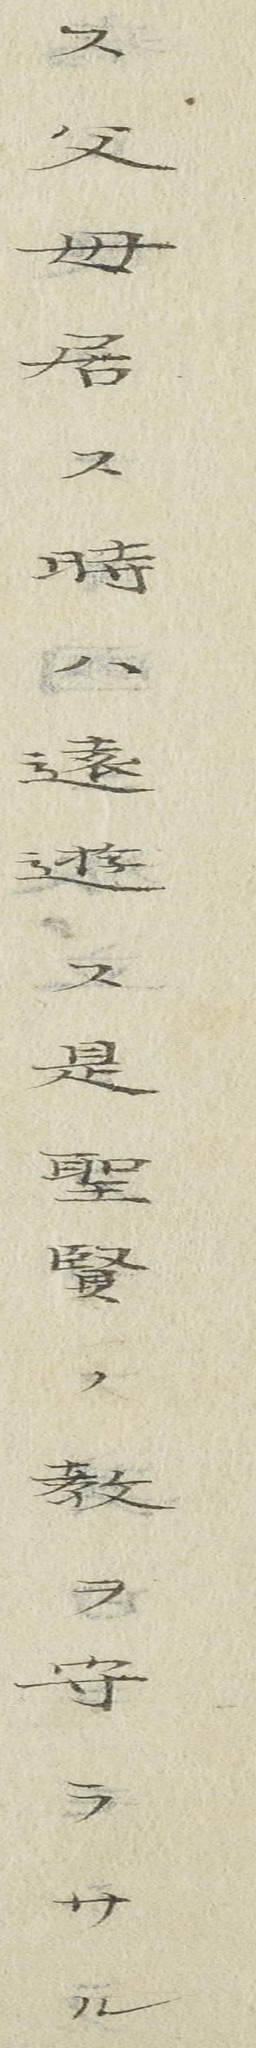ス父母居ス時ハ遠遊ス是聖賢ノ教ヲ守ラサル
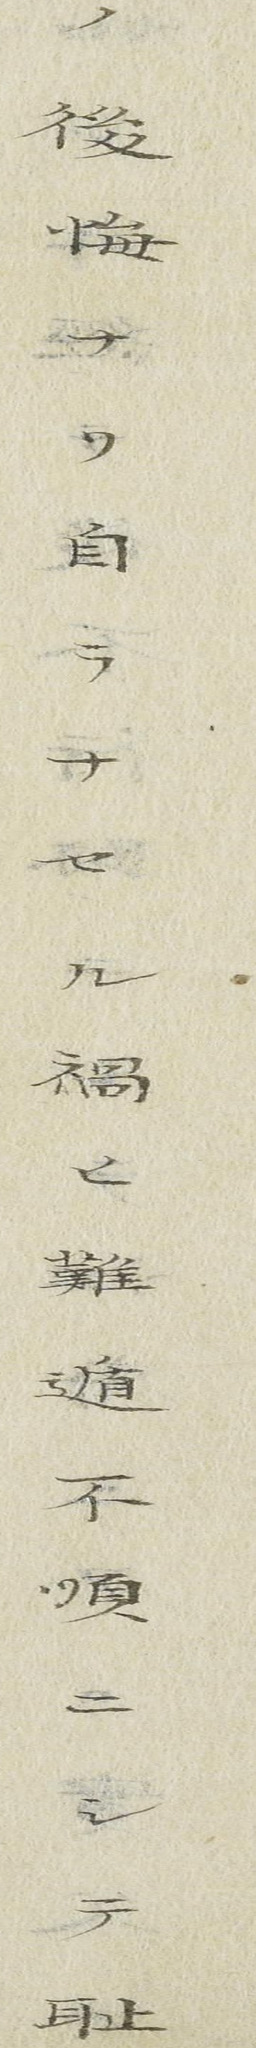ノ後悔ナリ自ラナセル禍ヒ難遁不順ニシテ恥
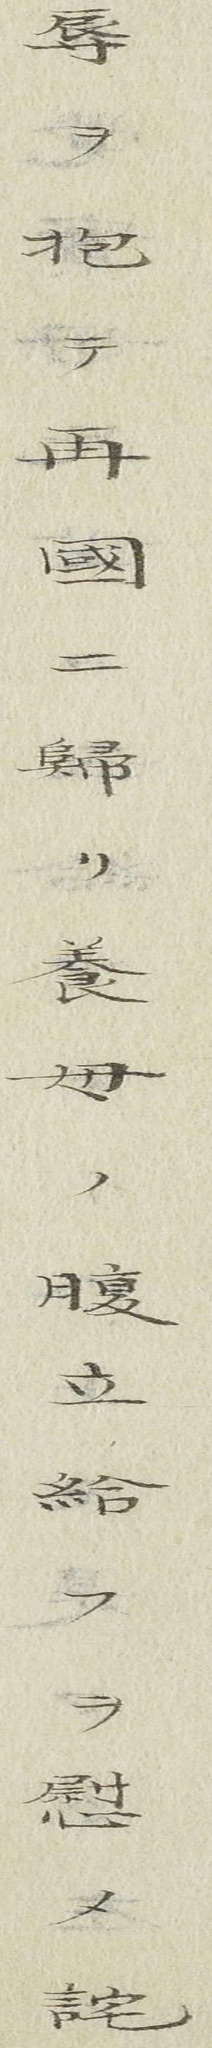辱ヲ抱テ再国ニ帰リ養母ノ腹立給フヲ慰メ詫
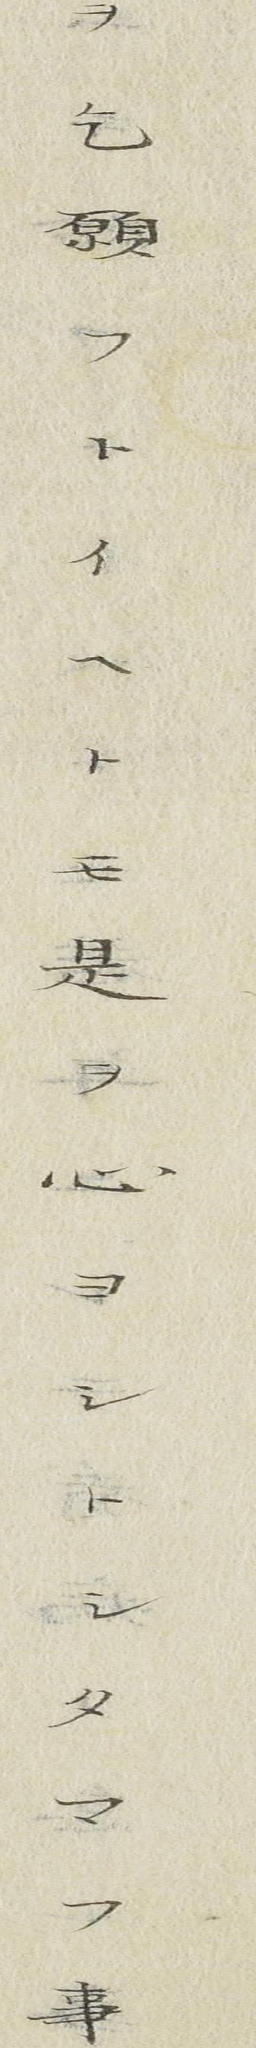ヲ乞願フトイヘトモ是ヲ心ヨシトシタマフ事
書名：地災撮要　地震之部　巻ノ二
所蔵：東京大学地震研究所図書室 Earthquake Research Institute Library, The University of Tokyo, JAPAN
